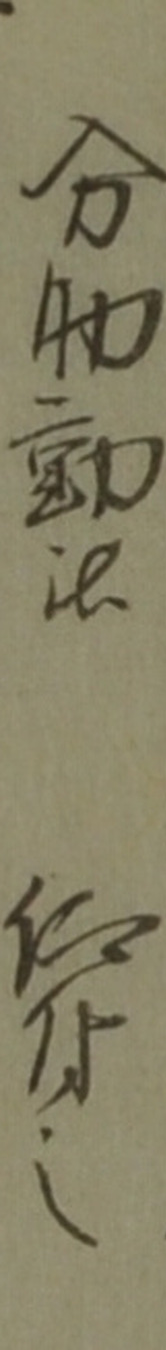分助勤被仰付之
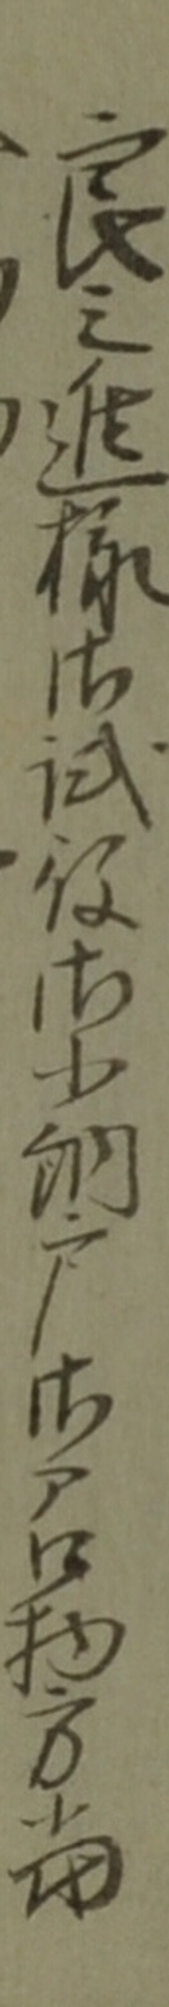良之進様御試役御小納戸御召物方当

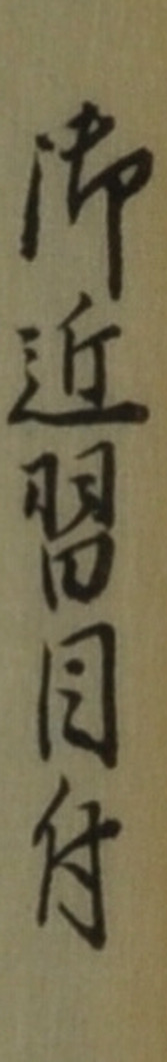御近習目付
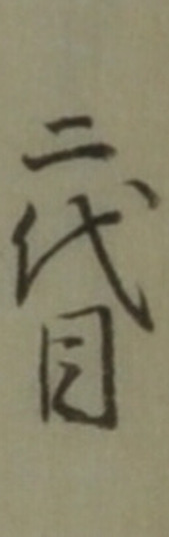二代目
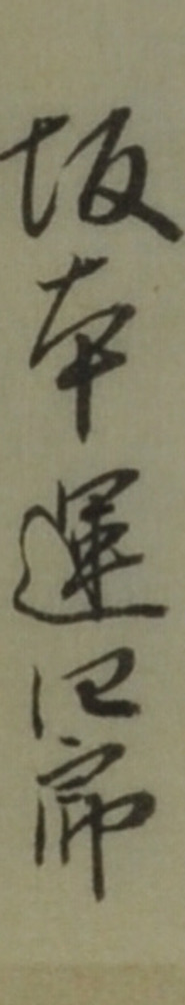坂本運四郎
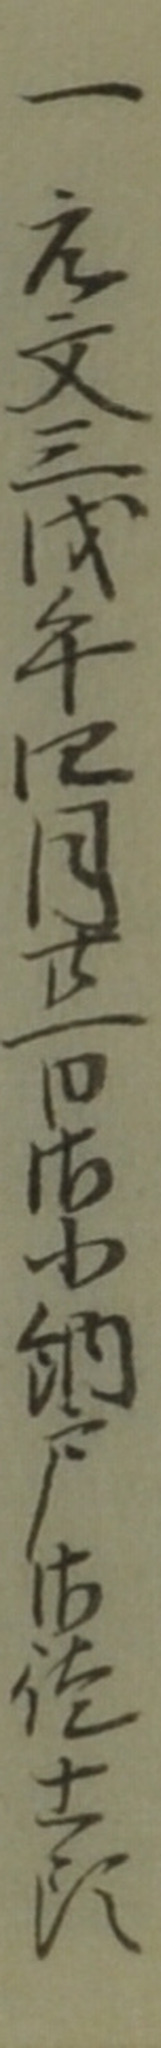一元文三戊午四月廿一日御小納戸御徒士頭
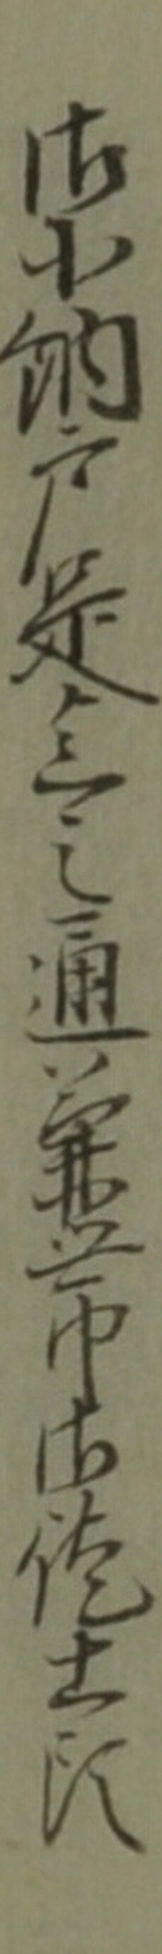御小納戸是迄之通兼帯御徒士頭
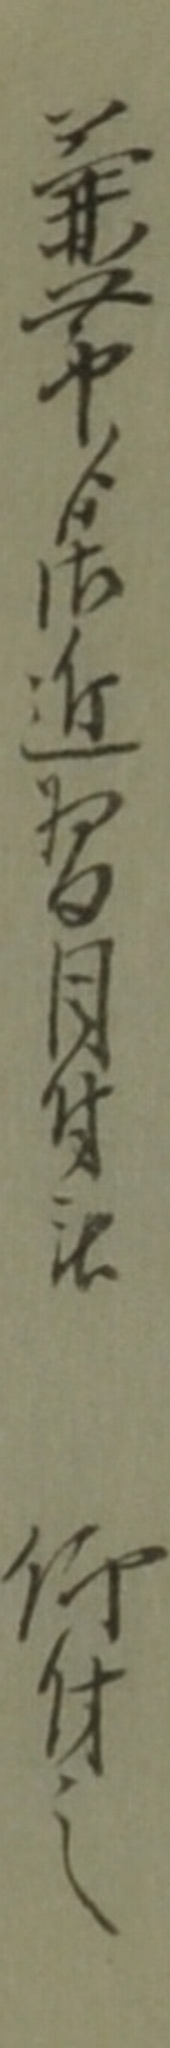兼帯ゟ御近習目付被仰付之
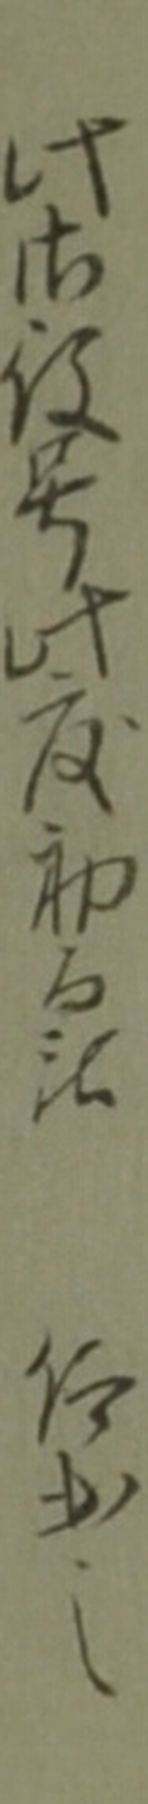此御役号此度初而被仰出之
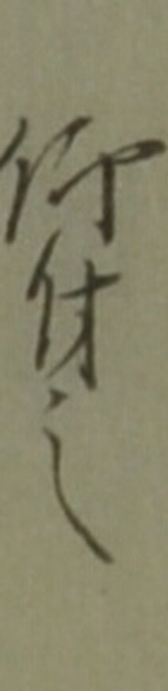仰付之
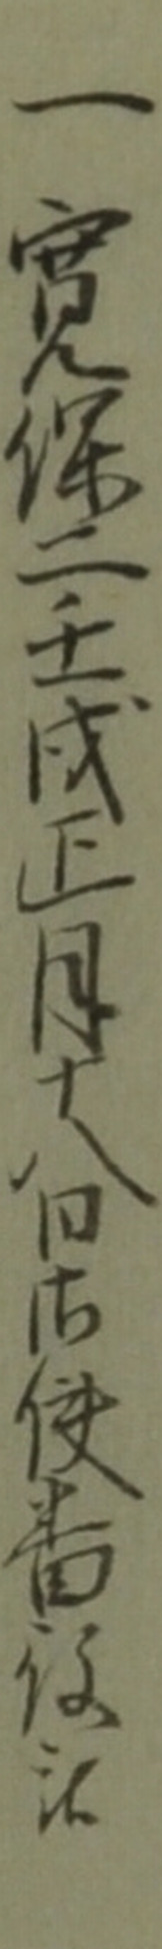一寛保二壬戌正月十八日御使番役被
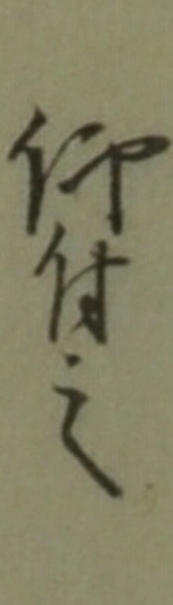仰付之
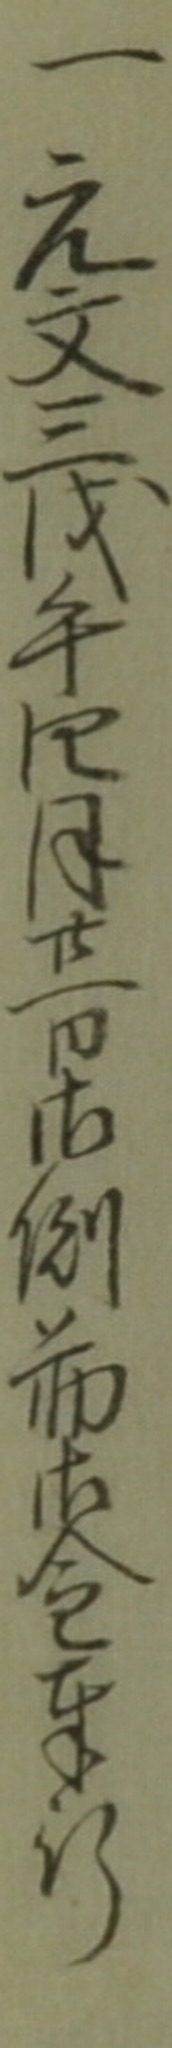一元文三戊午四月廿一日御側勤御御金奉行
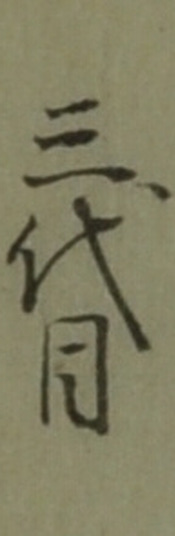三代目
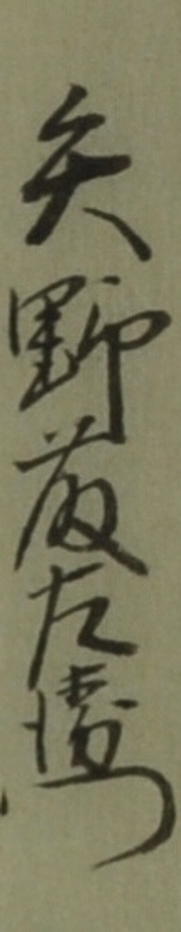矢野藤左衛門
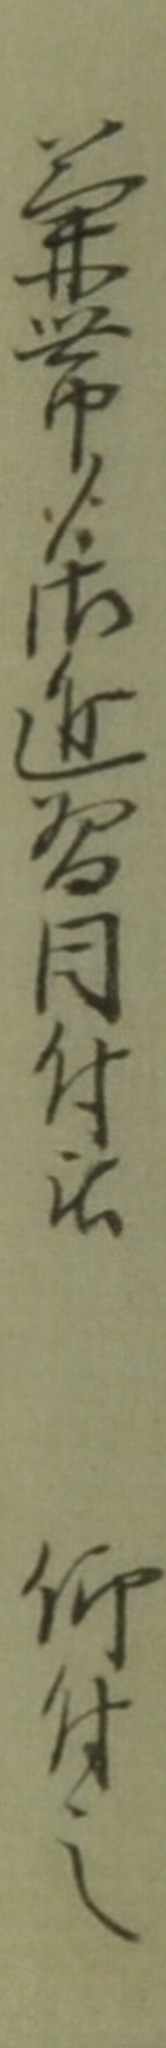兼帯ゟ御近習目付被仰付之
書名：諸御役代々録（四）
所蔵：伊那市立高遠町図書館・合同会社AMANE
